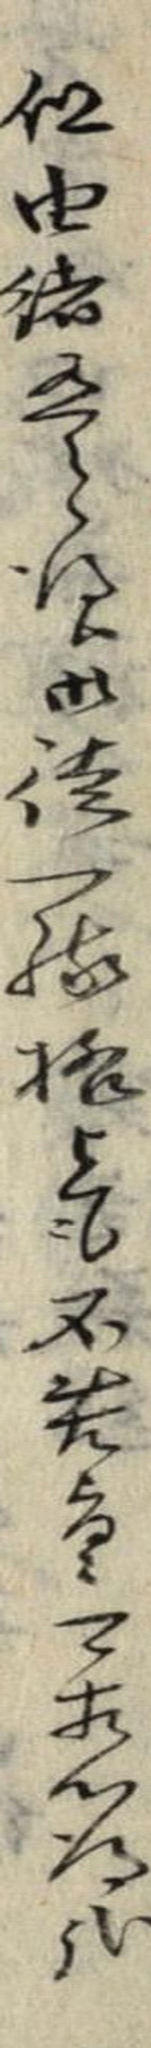但由緒有之候得ハ御徒一統格迄も不苦旨ニ可相心得哉
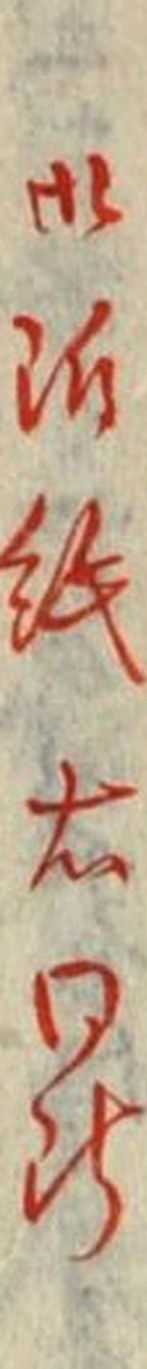御附紙右同断
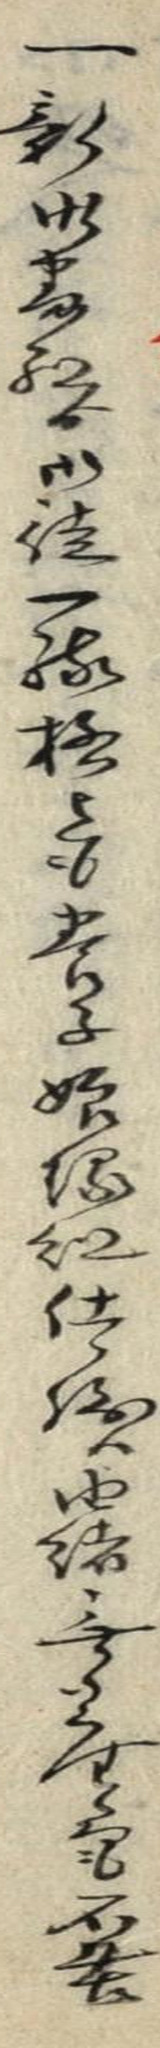一新御番組ゟ御徒一統格迄も養子娘縁組仕候儀ハ由緒無御座候而も不苦
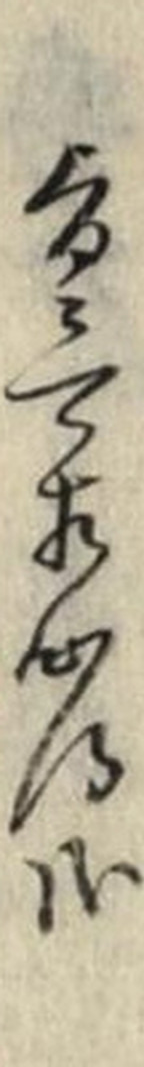旨ニ可相心得哉
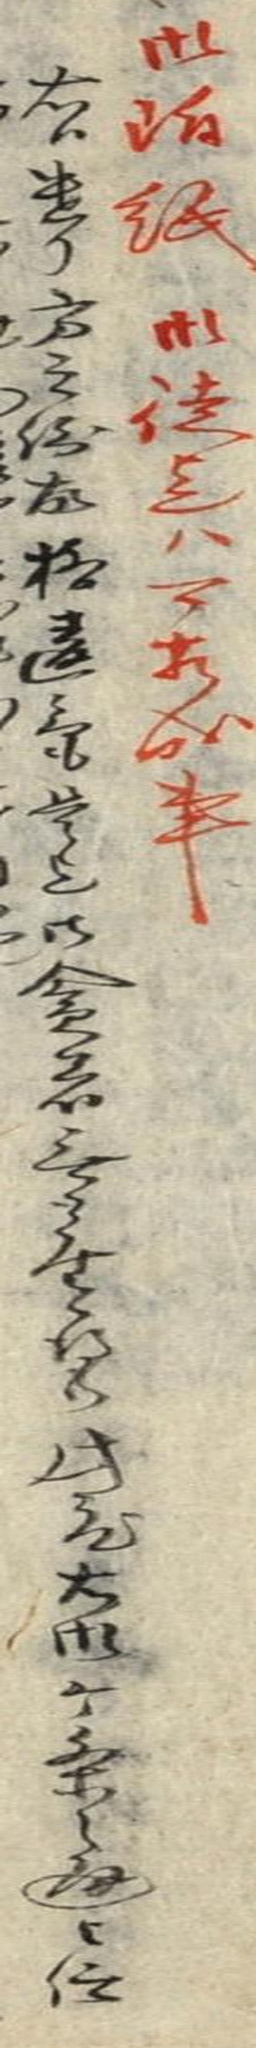右ハ遣り方之儀故格違ニ而も是迄御貪着無御座候得共此度右御ケ条之通被仰
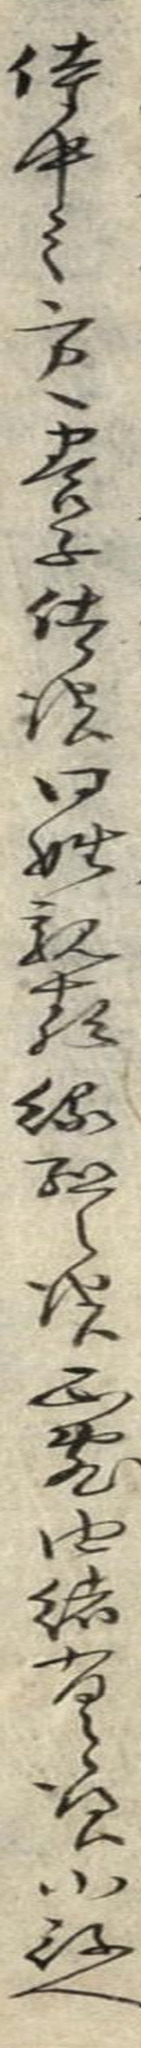一侍中之方ヘ養子仕候儀ハ同姓親類縁組之儀ハ正敷由緒有之候得ハ小役人
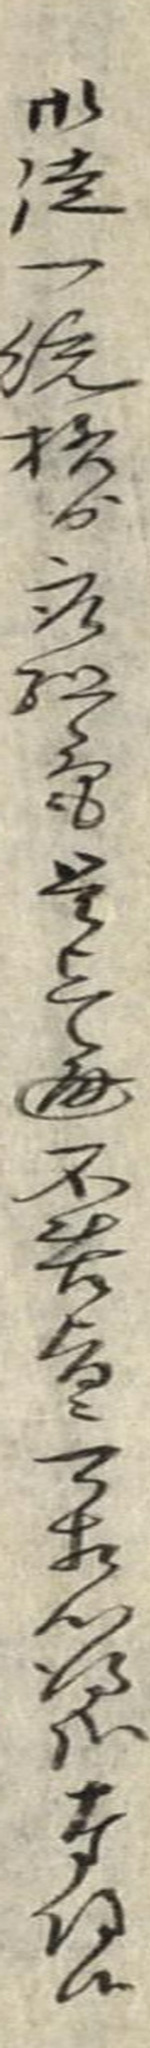御徒一統格ゟ取組候而も是迄之通不苦旨ニ可相心得哉奉伺候
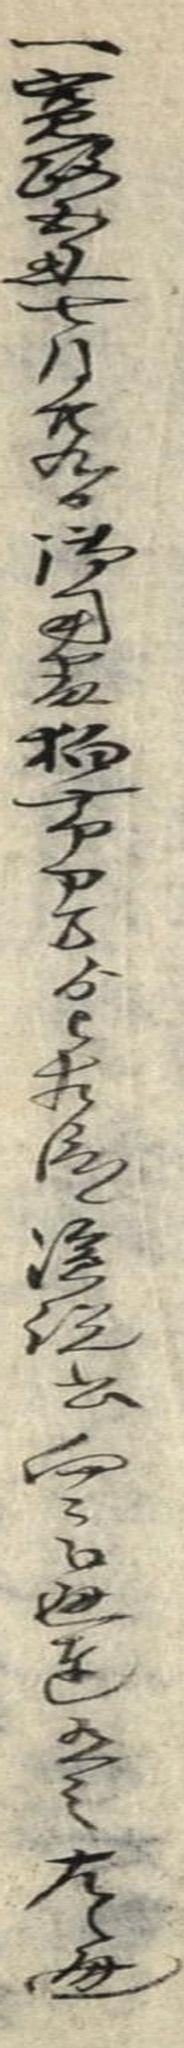一寛政五丑七月廿九日御用番狛帯刀ゟ被相渡候演説書向々江通達有之左之通

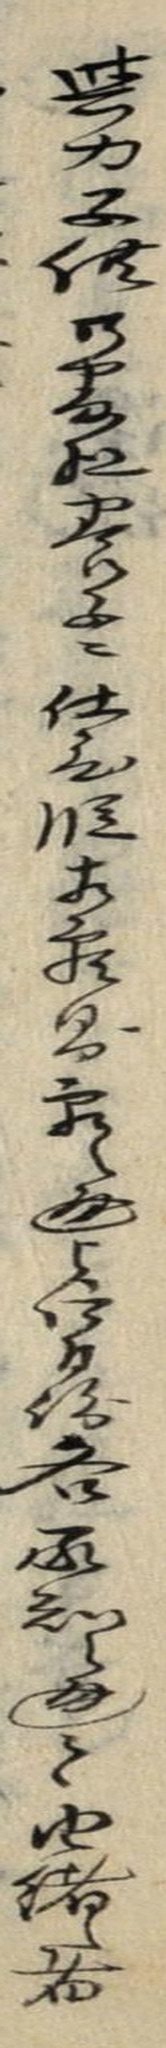与力子供御番組養子ニ仕度段相願則願之通被仰付儀各承知之通ニ候由緒之者
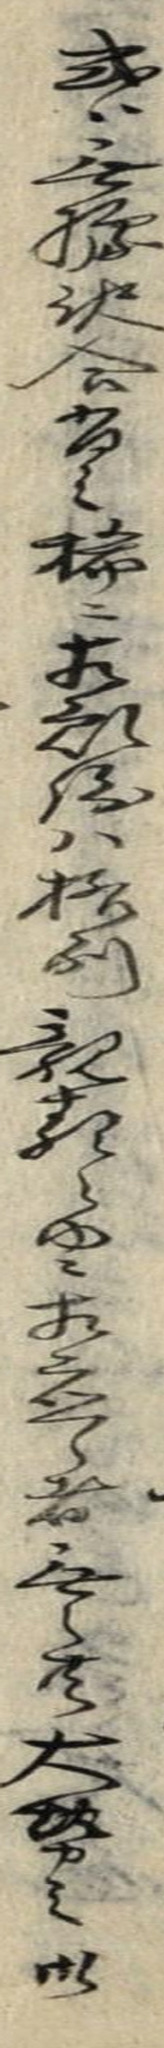或ハ無拠訳合有之稀ニ相願儀ハ格別親類の内ニ相応候者無之共大勢之御
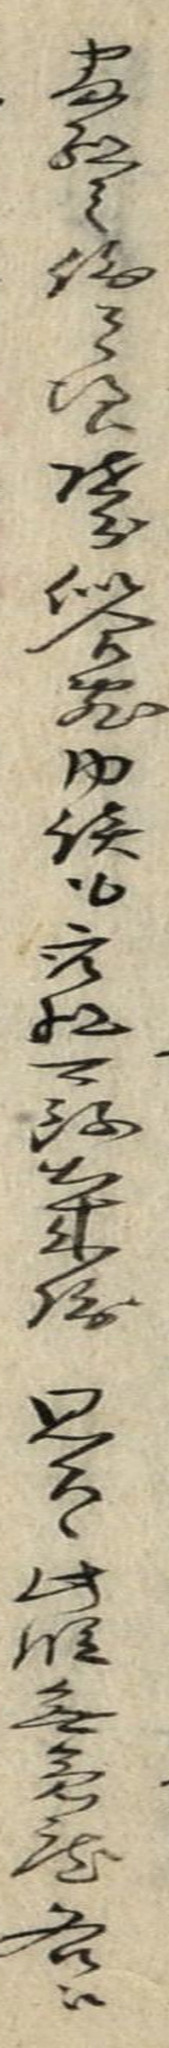番組之儀ニ候得ハ随分似合敷内談も取組可致出来儀思召候此段無急度各江
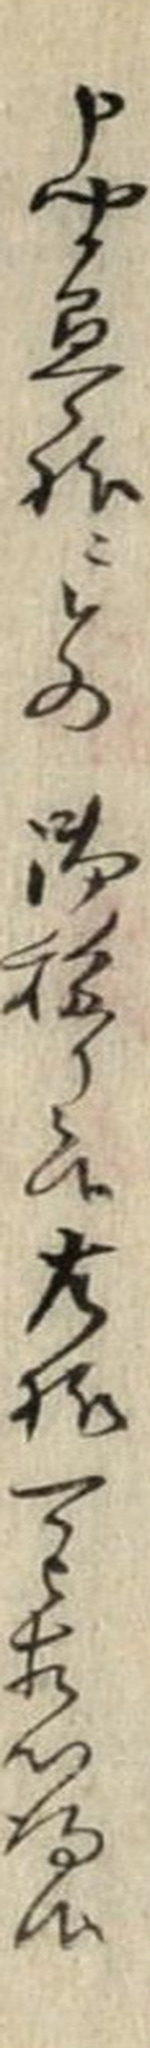申聞置候様ニとの御移りニ候左様可被相心得候
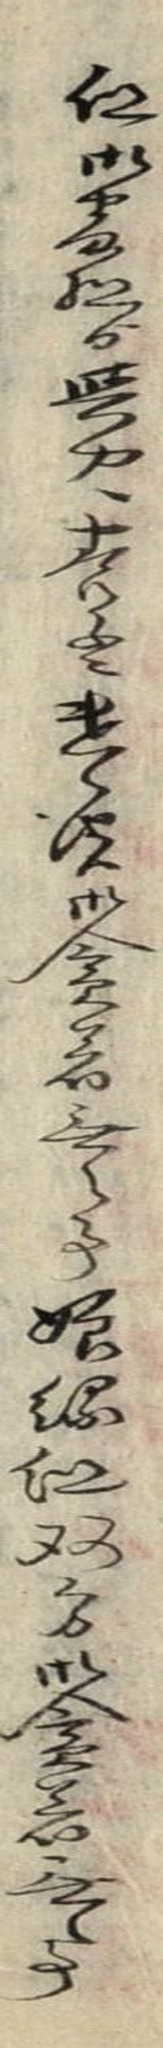但御番組ゟ与力ヘ養子ニ遣候儀ハ御貪着無之事娘縁組双方御貪着無之事
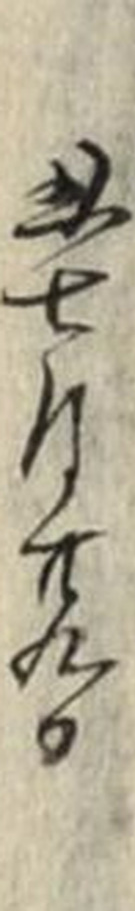丑七月廿九日
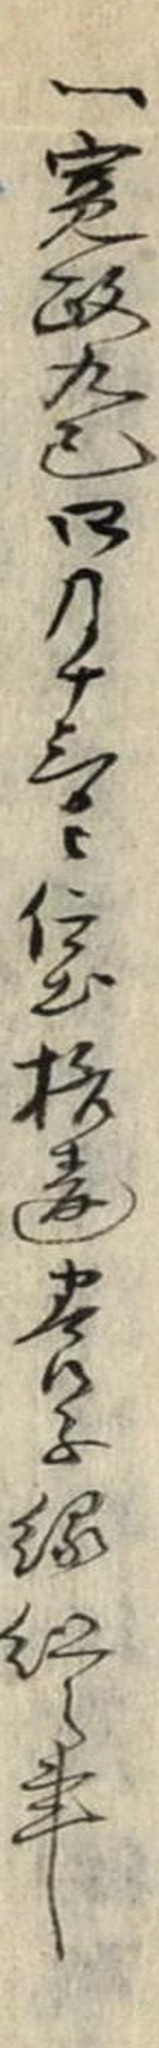一寛政九巳四月十三日被仰出格違養子縁組之事
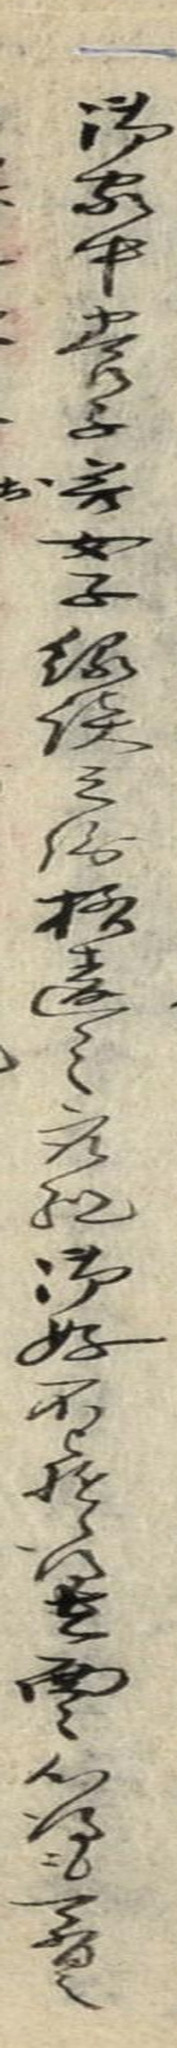一御家中養子并女子縁談之儀格違之取組御好不被遊候得者面々心得も可有之
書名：養子縁組之部
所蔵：福井県文書館 Fukui Prefectural Archives
